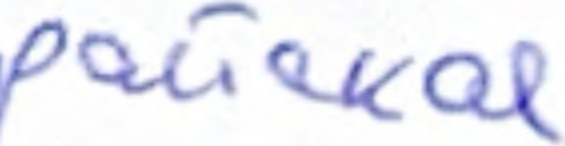райская
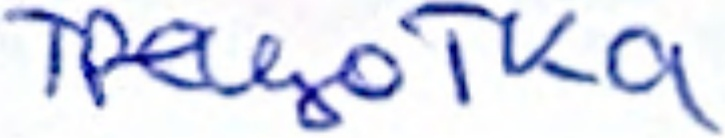трецотка
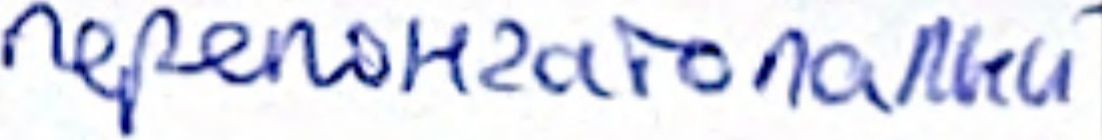перепончатопалый
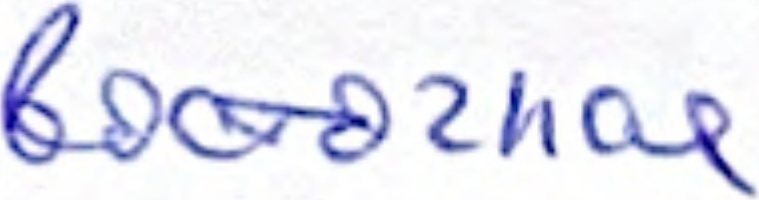восточная
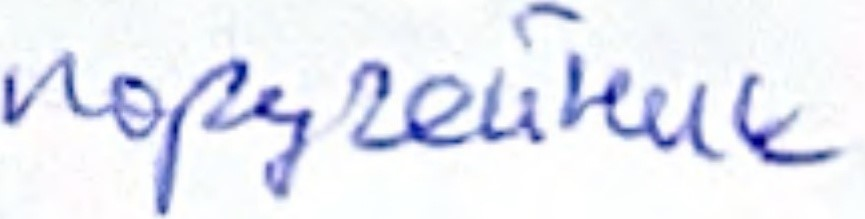поручейник
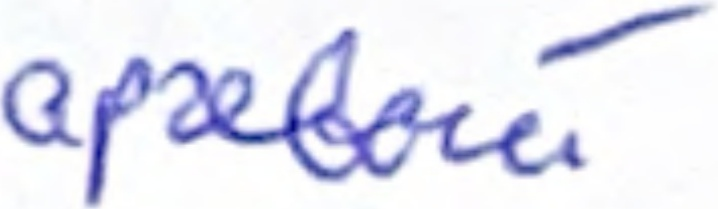арчевый
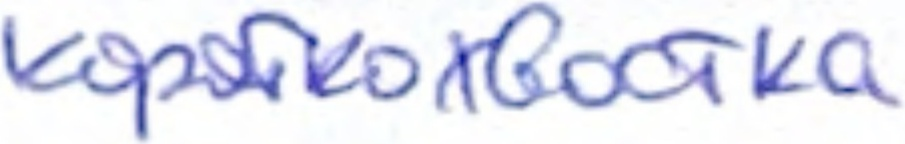короткохвостка
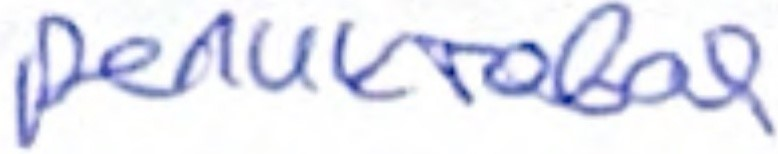реликтовая
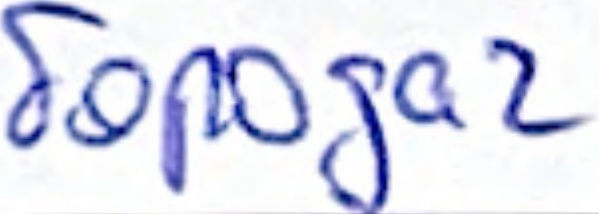бородач
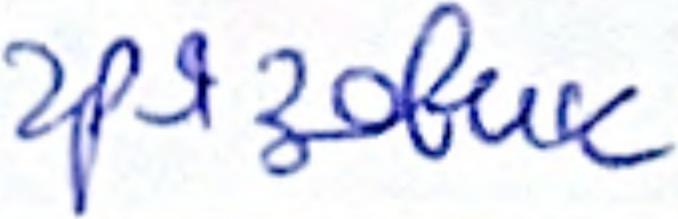грязовик
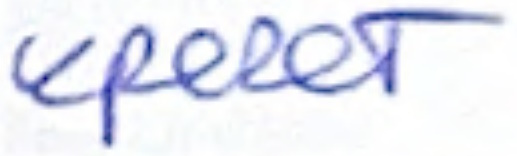кречет
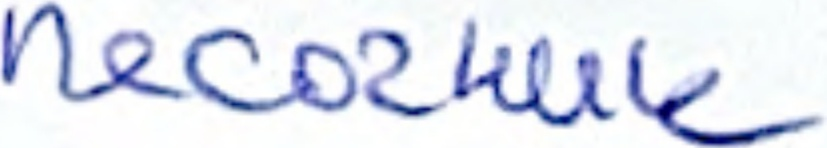песочник
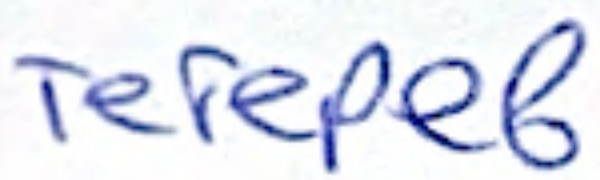тетерев
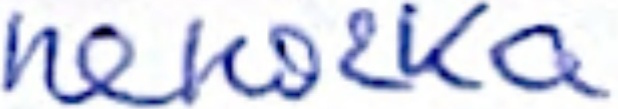пеночка
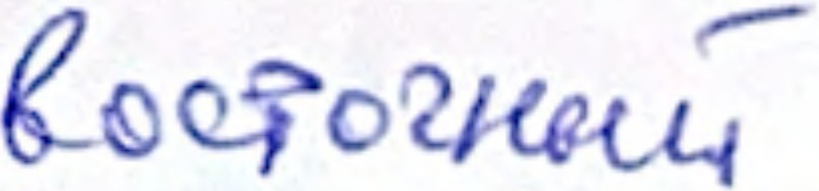восточный
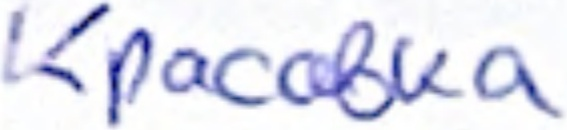красавка
